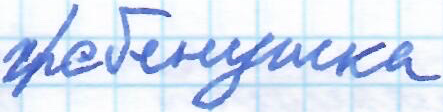гребенушка
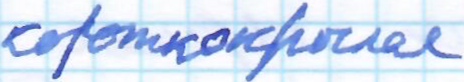короткокрылая
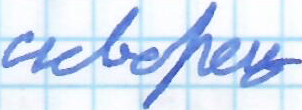скворец
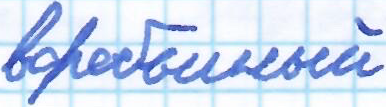воробьиный
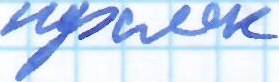пухляк
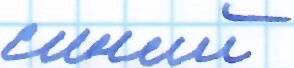синий
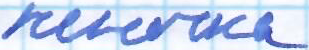пеночка
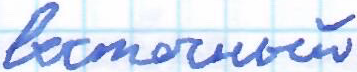восточный
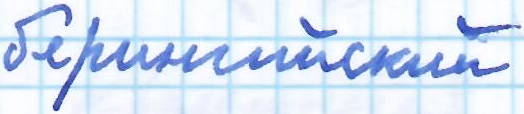берингийский
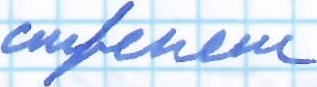стрепет
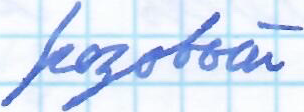розовый
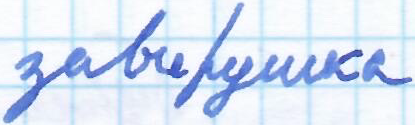завирушка
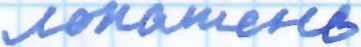лопатень
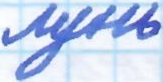лунь
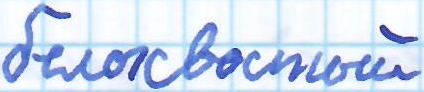белохвостый
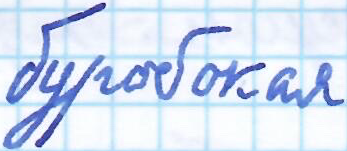буробокая
